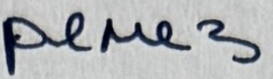ремез
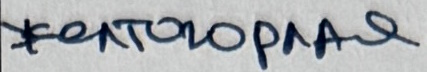желтогорлая
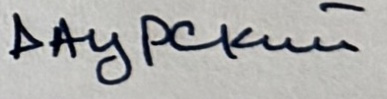даурский
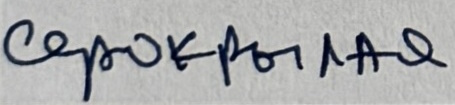серокрылая
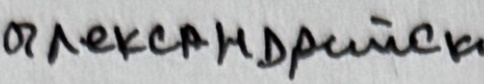александрийск
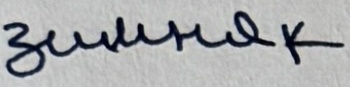зимняк
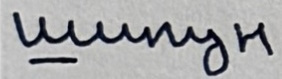шипун
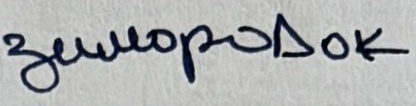зимородок
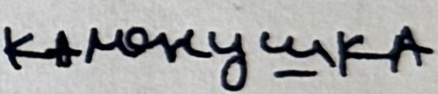камонушка
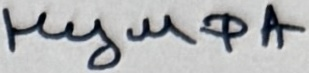нумфа
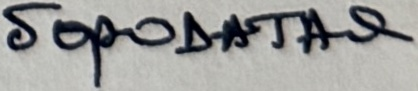бородатая
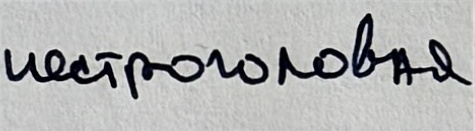пестроголовая
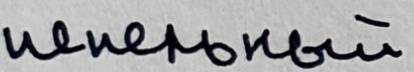пепельный
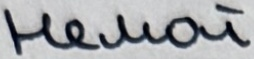немой
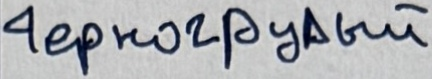черногрудый
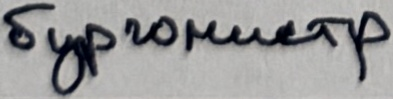бургомистр
